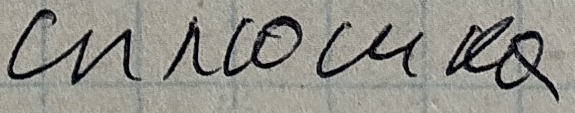сплюшка
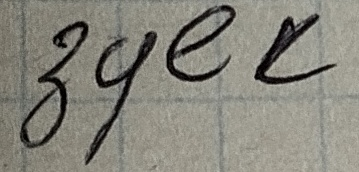зуек
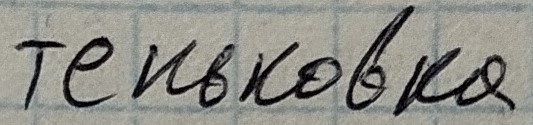теньковка
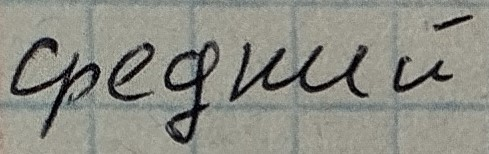средний
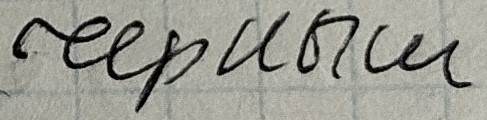черныш
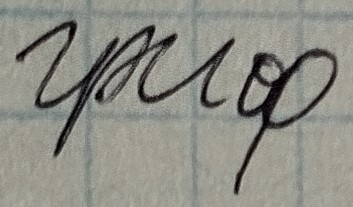гриф
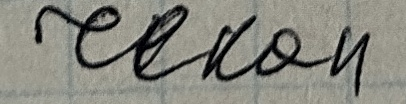чекан
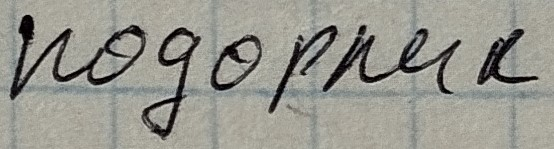подорлик
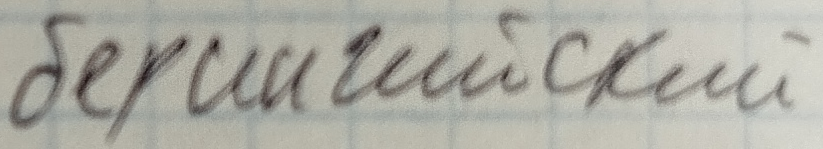берингийский
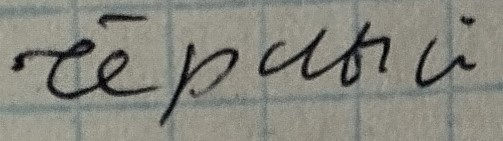чёрный
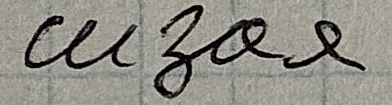сизая
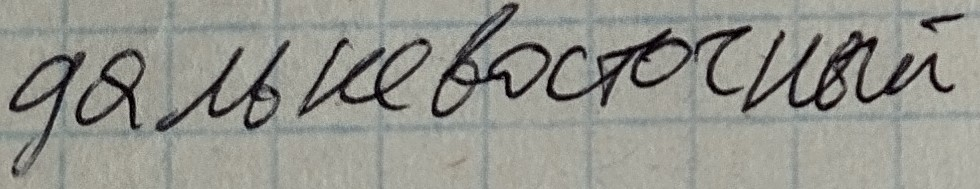дальневосточный
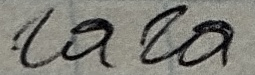гага
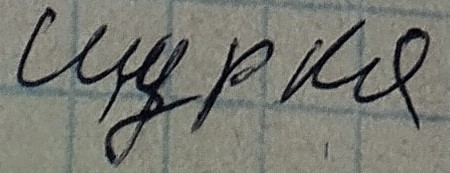щурка
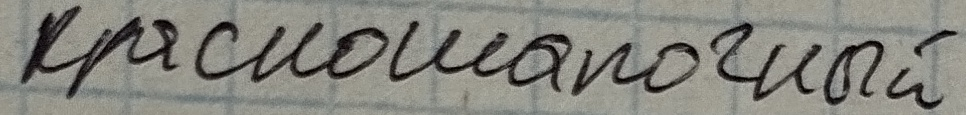красношапочный
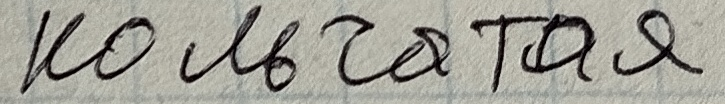кольчатая
